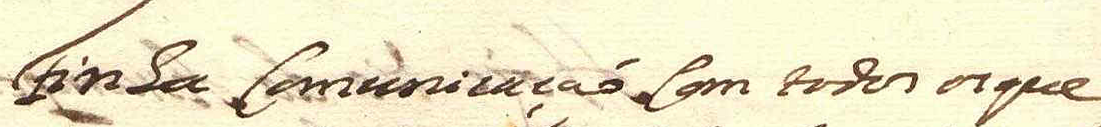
Tinha Comunicaçaõ Com todos os que
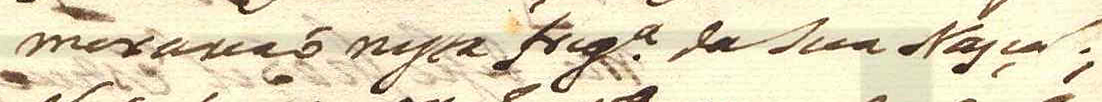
morauaõ nesta freg.a da sua Nasça;
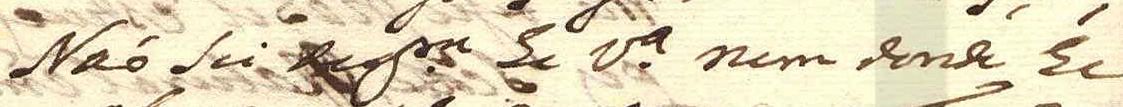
Naõ sei de q.m hé V.a nem donde he
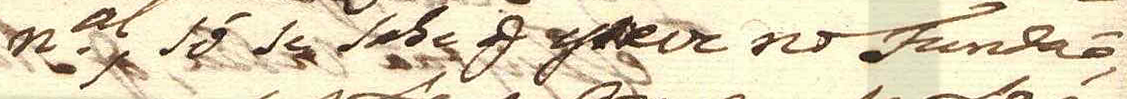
n.al, só se sabe q̄ esteve no Fundaõ
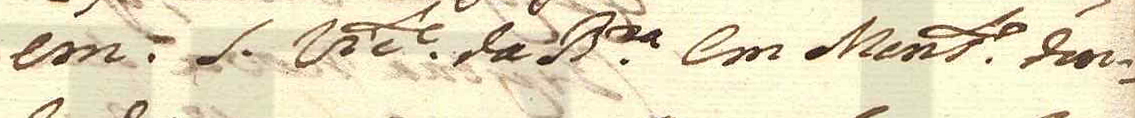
em. s. Vic.te da B.ra em Mons.to don
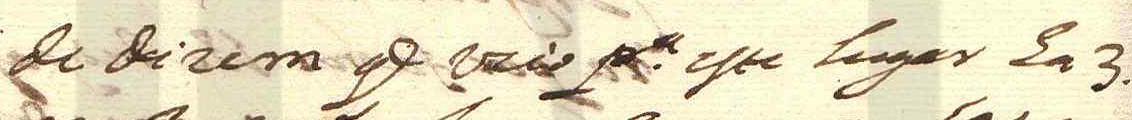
de dizem q̄ veio p.a este lugar ha 3.
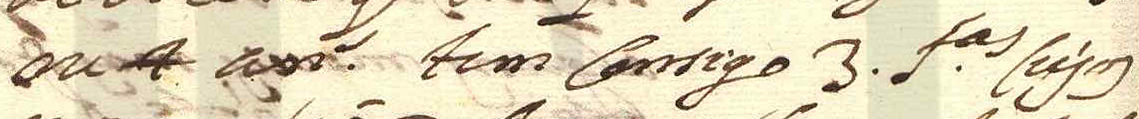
ou 4 an.s tem Consigo 3. t.as Cujos
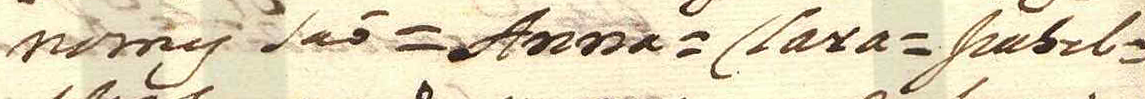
nomes saõ = Anna = Clara = Jzabel
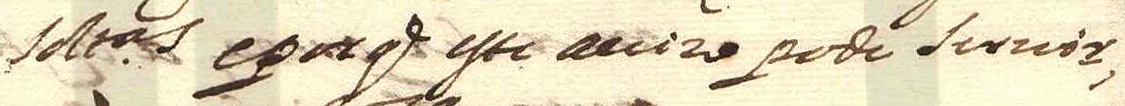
solt.as e porq̄ este auizo pode seruir,
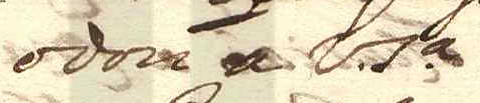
o dou a V. S.a
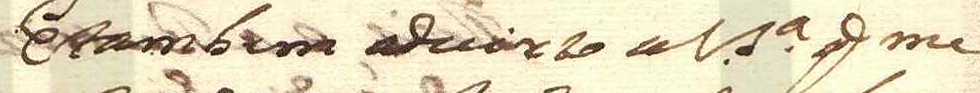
E tambem aduirto a V S.a q̄ me
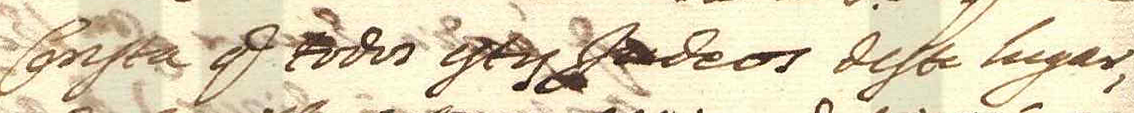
Consta q̄ todos estes Judeos deste lugar,
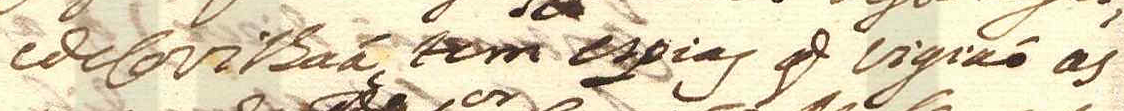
e de Covilhaã tem espias q̄ vigiaõ as
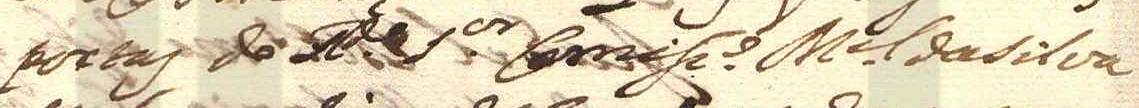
portas do R.do S.or Comiss.o M.el da Silva
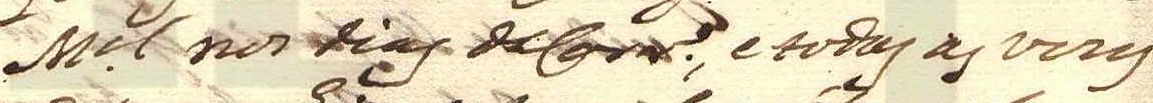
M.el nos dias de Corr.o, e todas as vezes
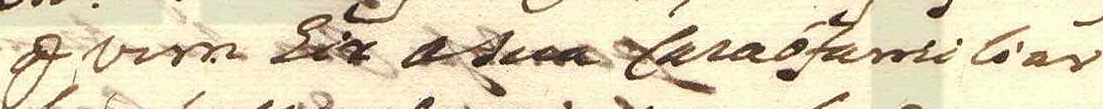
q̄ vem hir a sua Caza o familiar
